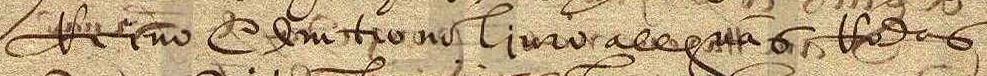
Reino e demtro no ljuro allguās Rodas
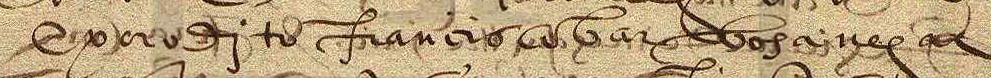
e por o djto francisco barbosa negar
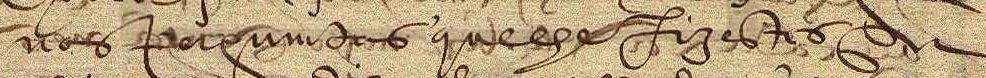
nas pergumtas que lhe fizestes ser
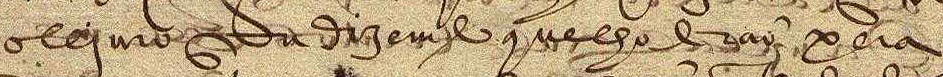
o lljuro seu dizemdo que lho deraõ pera
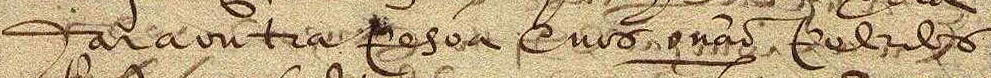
dar a outra pesoa e uos o naõ poderdes
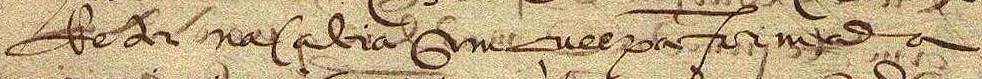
Reter na Cadeia sem cullpa firmada
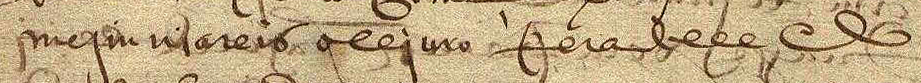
me jmuiareis o lljuro pera delle e do
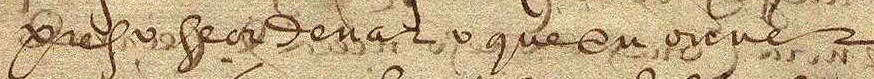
preso se ordenar o que eu ouuer
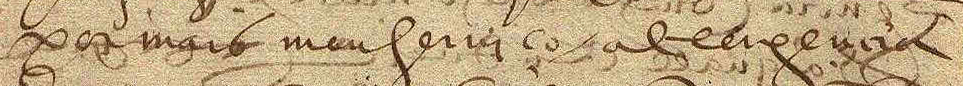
por mais meu seruiço / a delligencia
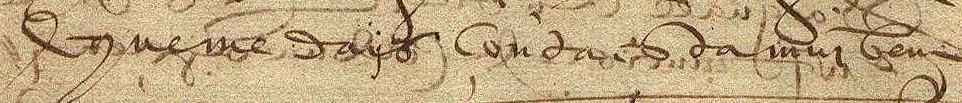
de que me dajs conta esta muj bem
